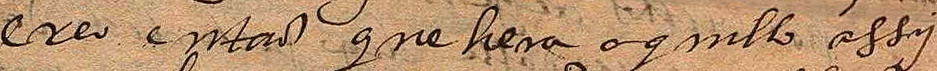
creo entaõ que hera aquillo assy
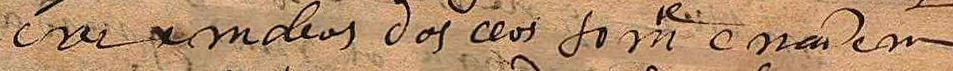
e crer em deos dos ceos somte e não em
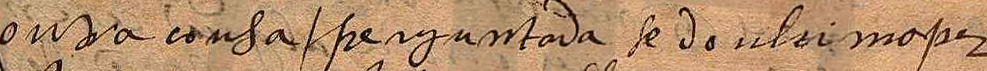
outra cousa (perguntada se do ultimo per
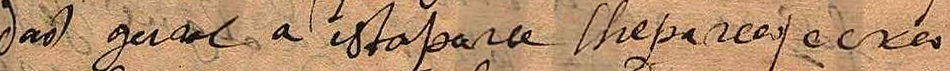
daõ geral a esta parte lhe parceo) e creo
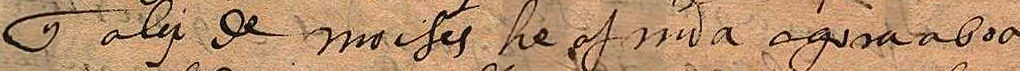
q̄ a lej de moises he ajmda agora a boa
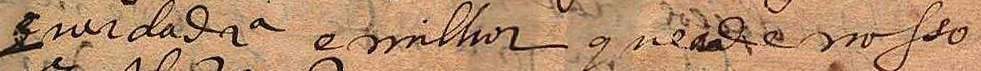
E uerdadra e milhor que a de nosso
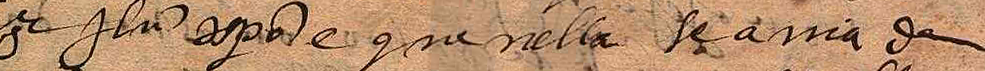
sor Jhū xpō e que nella se auia de
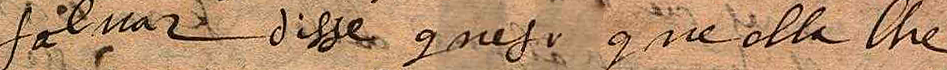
saluar disse que se que ella lhe
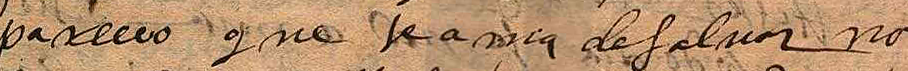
pareceo que se auia de saluar na
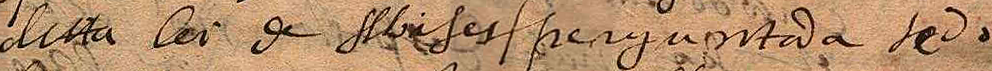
ditta lei de Moises (perguntada se do
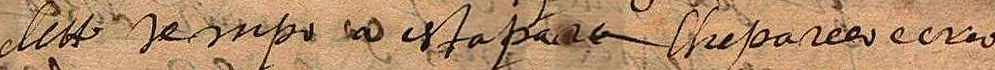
ditto tempo a esta parte lhe parceo e creo
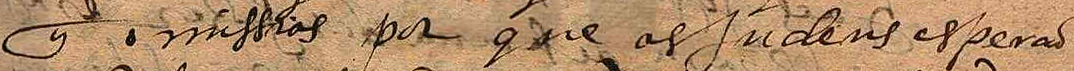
q̄ o missias por que os Judeus esperaõ
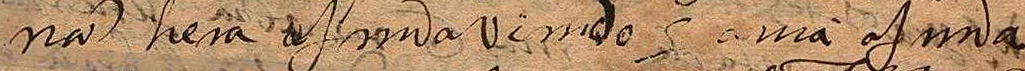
naõ hera aJmda vimdo E auia aJmda
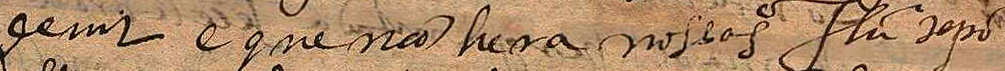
de uir e que naõ hera nosso sor Jhū xpō
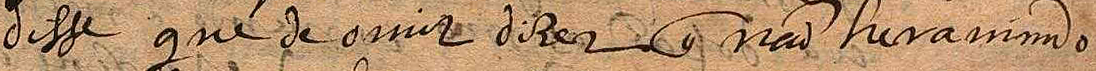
disse que de ouuir dizer q̄ naõ hera uimdo
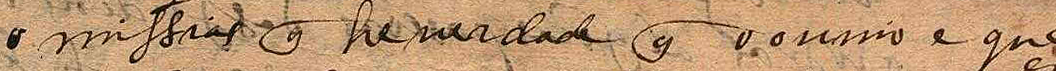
o missias q̄ he uerdade q̄ o ouuio e que
